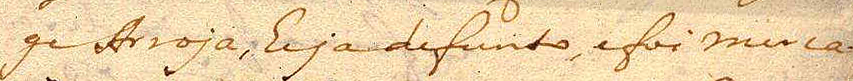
ge Arroja, he ja defunto, e foi merca
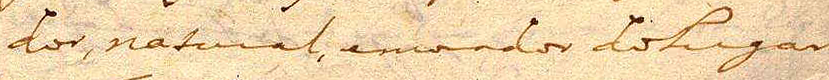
dor, natural, e morador do Lugar
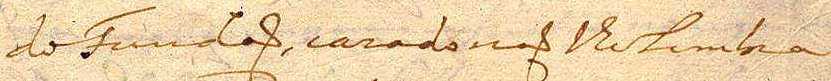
do Fundaõ, cazado naõ lhe Lembra
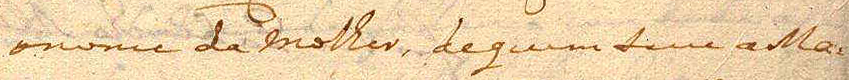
o nome da molher, de quem teue a Ma
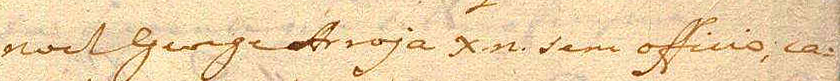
noel George Arroja x. n. sem officio, ca
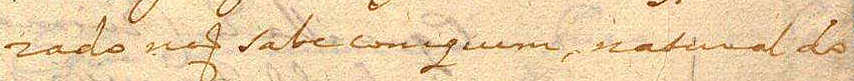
zado naõ sabe com quem, natural do
